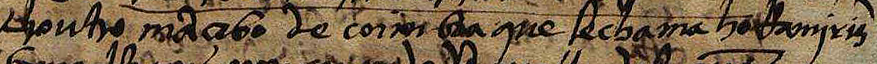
houtro mācebo de coimbra que se chama ho Ramjris
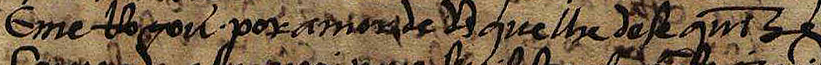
E me Rogou por amor de ds̄ que lhe dese q̄uise
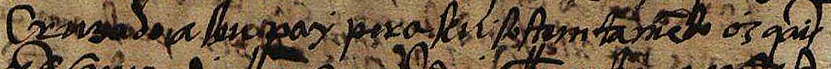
Cruzado a seu pay pera seu sostemtamēto os qāis
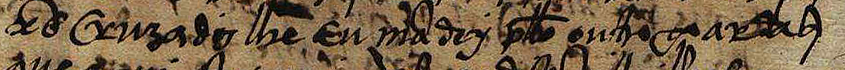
x̄b Cruzados lhe Eu mādey p̄llo outro goarda q̄
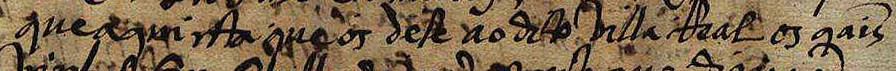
que aqui esta que os dese ao dito villa Real os qāis
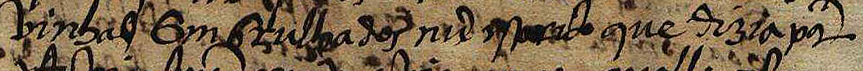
vinhaõ Embrulhados nū esp?rito que dizia por
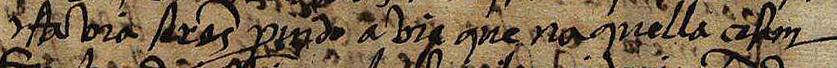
esta via seras ꝓuido avia que naquella casam
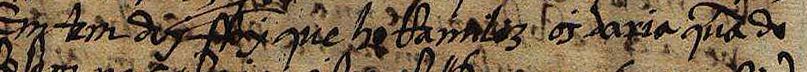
Emtemdey ffoy que ho Ramiliz os daria q̄uado
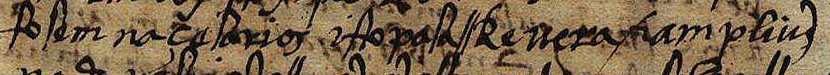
fosem nacesarios isto pasa // Reuera e amplius
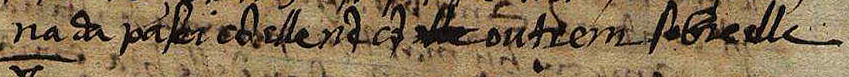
nada pasei cō Elle nē cō _ outrem sobre elle
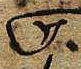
c̄ꝭ
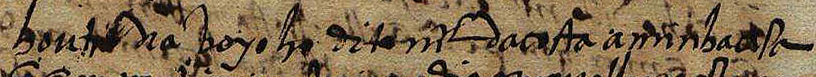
houtro dia veyo ho dito mel da costa a minha casa
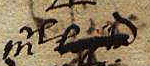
mel leytā
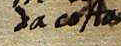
da costa
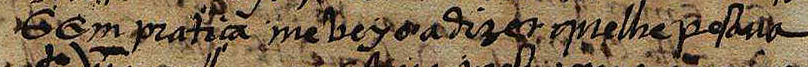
E Em pratica me veyo a dizer que lhe pesaua
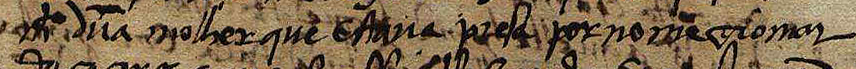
mto dūa molher que Estaua presa por nome giomar
